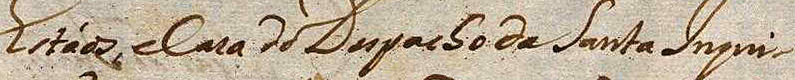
Estáos, e Caza do Despacho da Santa Inqui
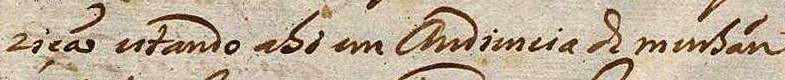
zição estando ahi em audiencia de menhãn
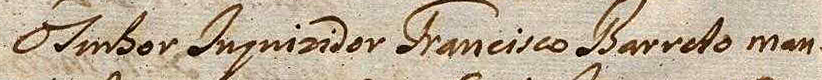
o senhor Inquizidor Francisco Barreto man
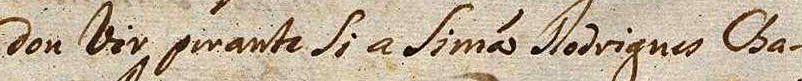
dou Vir perante Si a Simão Rodrigues Cha
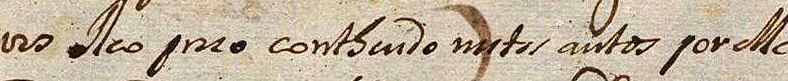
ves Reo preso contheudo nestes autos por elle
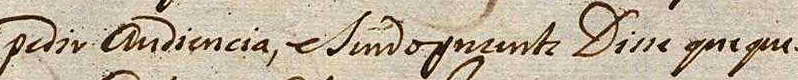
pedir audiencia, e Sendo presente Disse que que
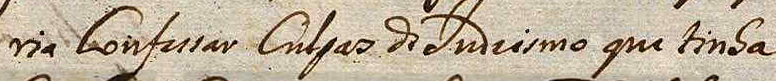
ria Confessar Culpas de Iudaismo que tinha
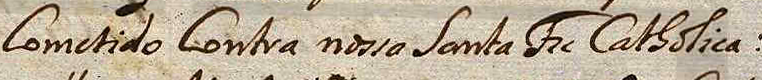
Cometido Contra nossa Santa Fee Catholica:
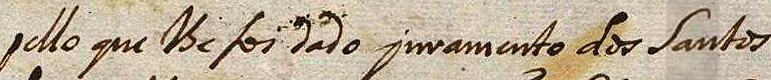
pello que lhe foi dado juramento dos Santos
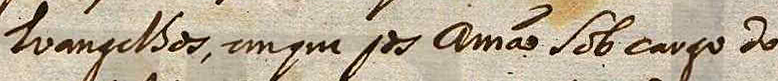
Evangelhos, em que pos a mão Sob cargo do
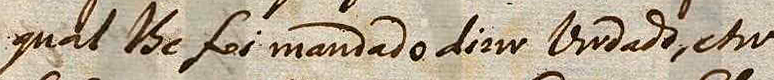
qual lhe foi mandado dizer Verdade, e ter
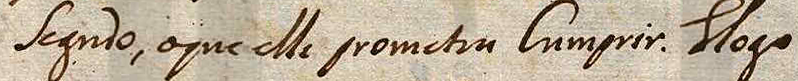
Segredo, o que elle prometeu Cumprir. E logo
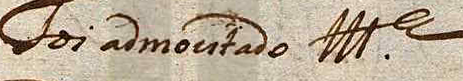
Foi admoestado ttt.a
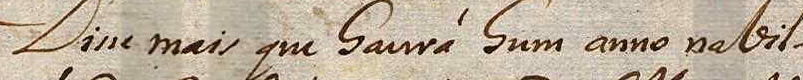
Disse mais que hauerá hum anno na Vil
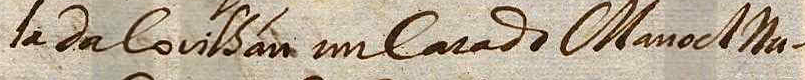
la da Covilhãn em Caza do Manoel Nu
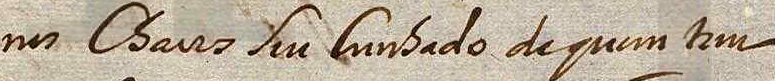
nes Chaves seu Cunhado de quem tem
